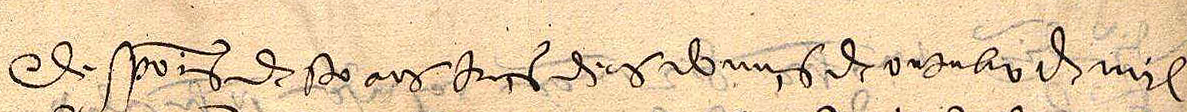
e desp̄ois desto aos tres dias do mes de outubro de mjl
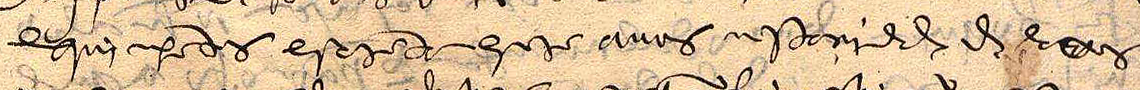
e qujnhētos e setēta sete anos nesta çidade de lagos
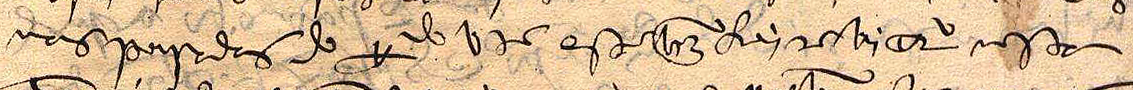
nas pousadas do ꝟdo vte estevez̄ frejre vigro nesta
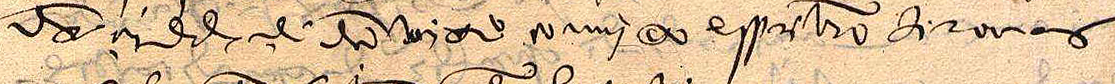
dt̄a çidade he d̄to vigro comjgo espreveo trovas
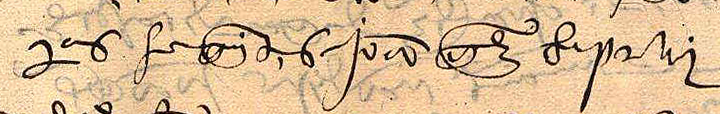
tas seḡujtes João ḡlz ho prvj
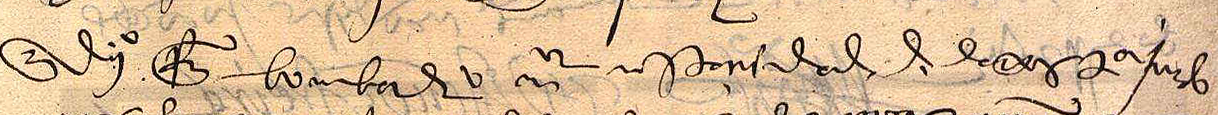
item djo f̄rz bombadro mor nesta çidade de lagos ta Jurado
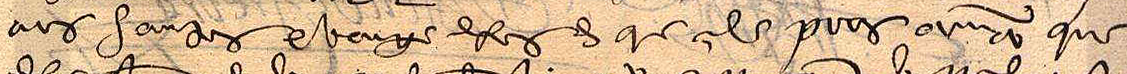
aos Santos evangelhos e qe ele poos a mão que
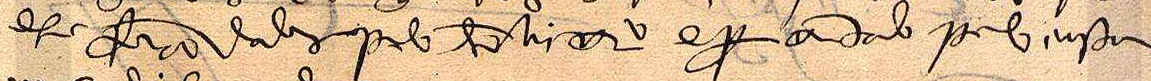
lhe forão dados pelo d̄to vigro e ꝑgūtado pelo custu
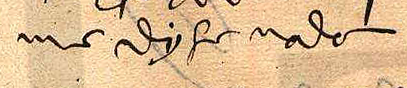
me dyse nada
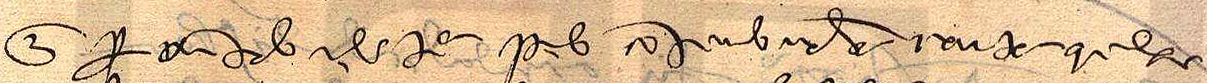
item ꝑgūtado ele ta pelo cōteudo n d̄ta carta que lhe
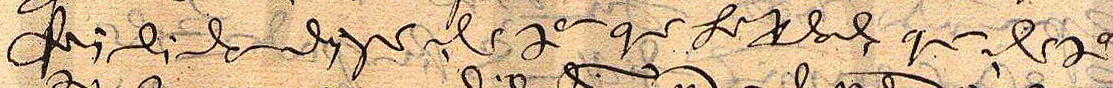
foy lida dyse ele ta que he ꝟdade que ele ta
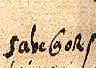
sabe q̄ o R
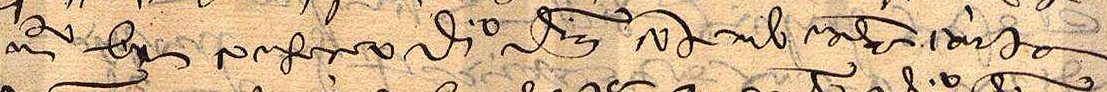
mto bem conheçeo dio d̄ias cōteudo na d̄ta carta
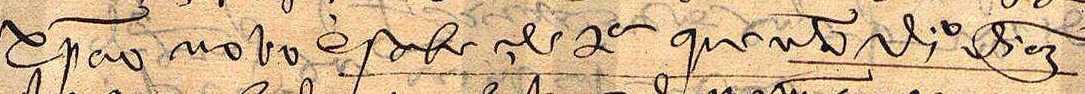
xpão novo e sabe ele ta que o ħo dio d̄iaz
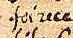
foi rece
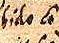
bido ho
